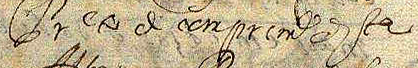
Preso d comprimto desta
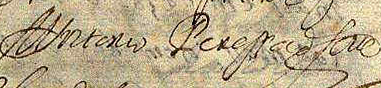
Antonio Perejra d
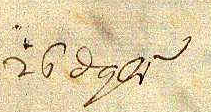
26 d 9bro
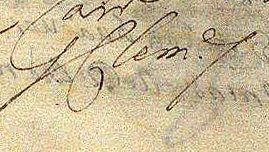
G.ar Clem.e
